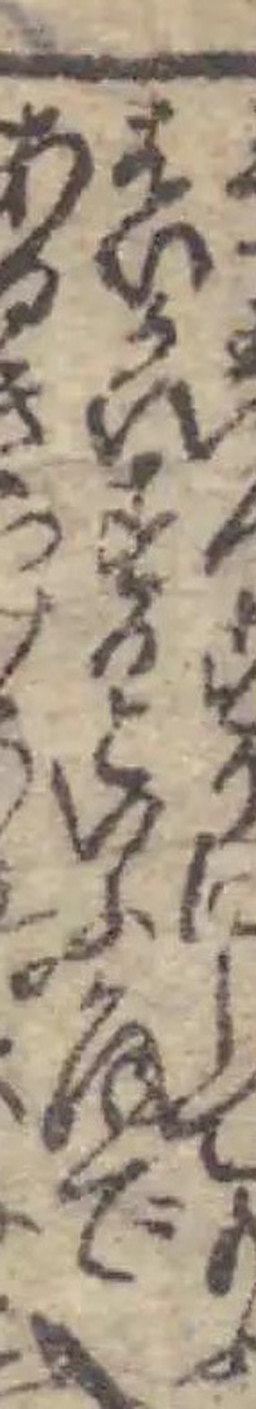はいかいするといふかほで
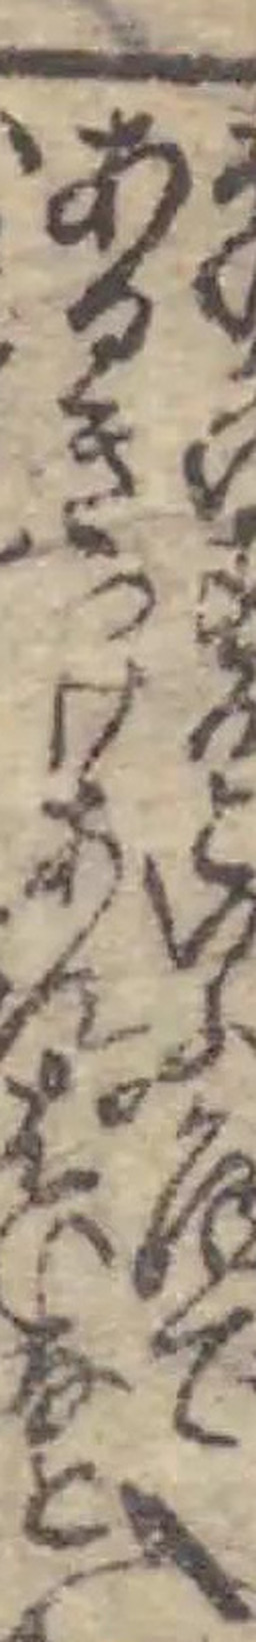あるきつけあんばいなと
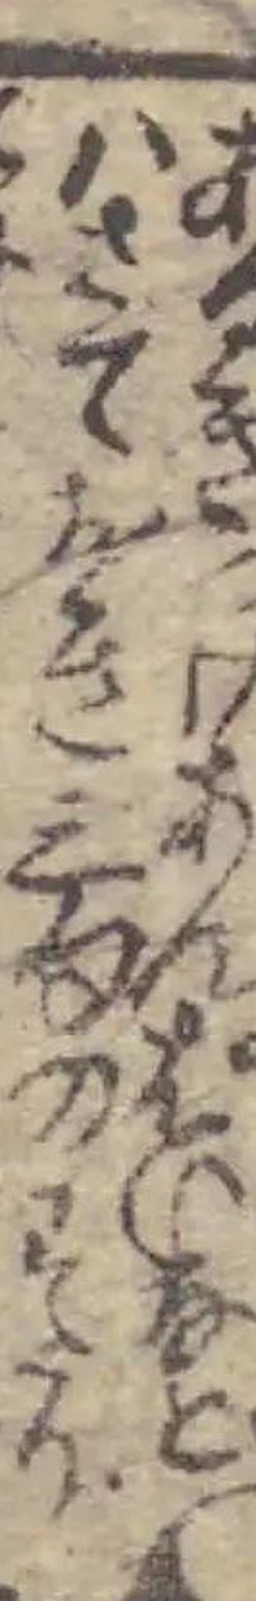はさておき三句のわたり
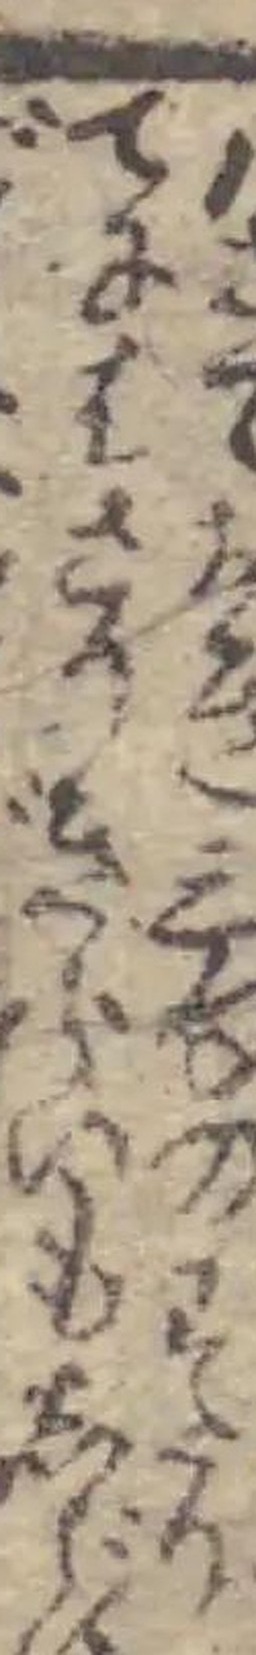てにはさりきらいもしらず
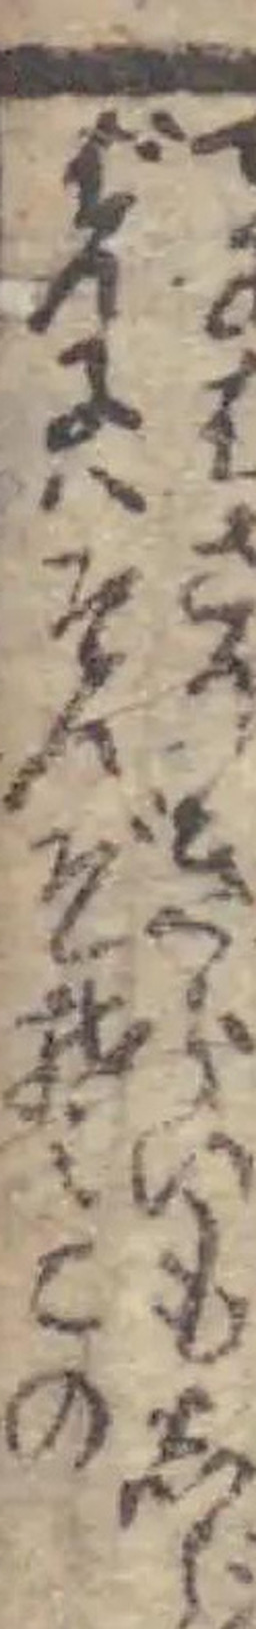ばんにはそんぞそこの
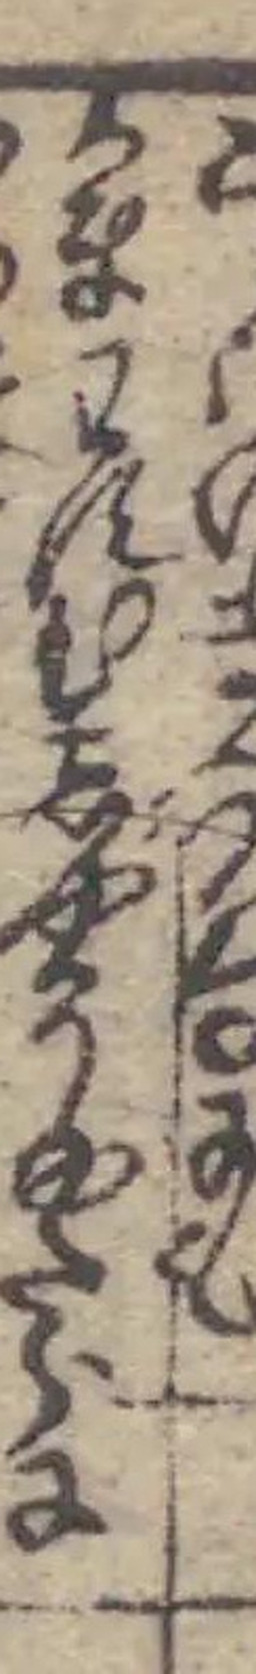かまわすむしやうやたらに
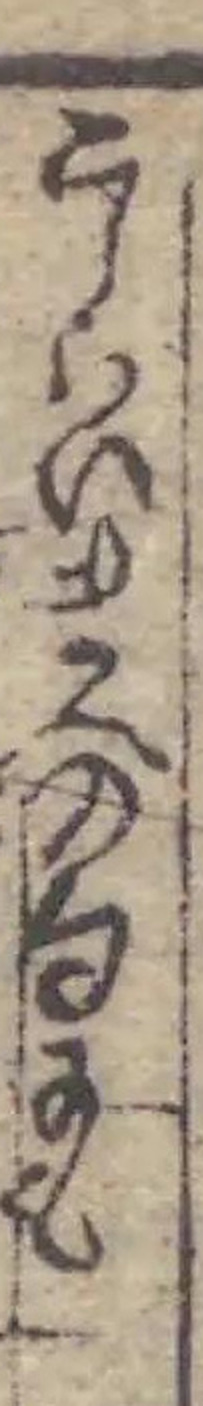こしらいまへの句にも
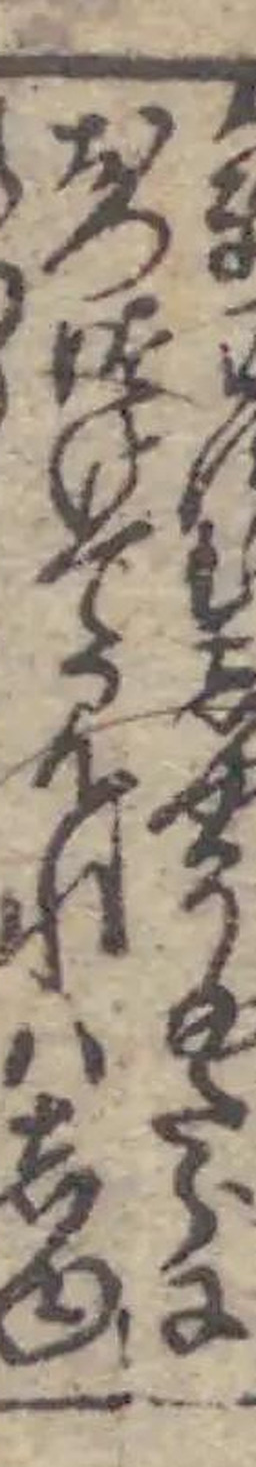おつつけてみれはしゆ
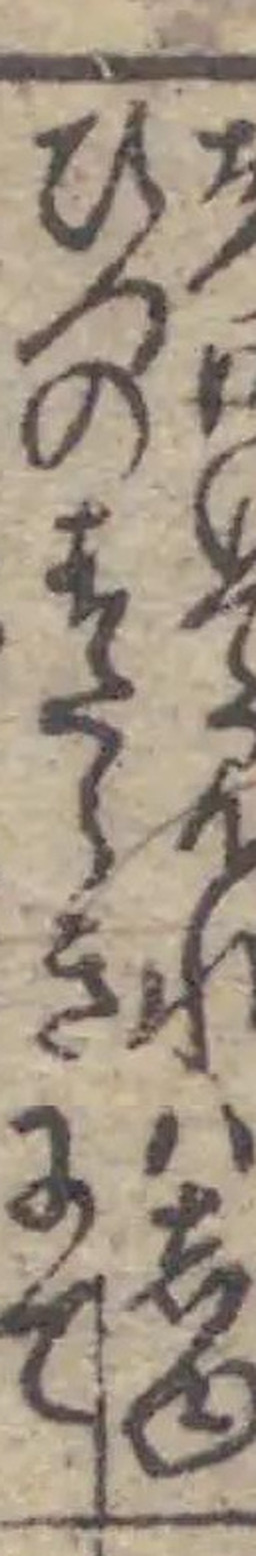ひつのはたらきにて
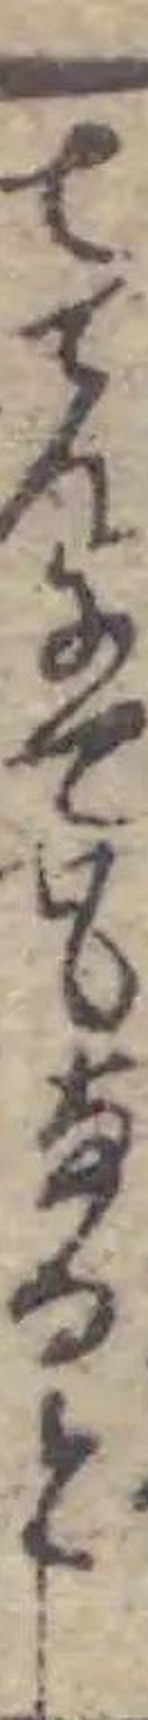ててんにてもなると
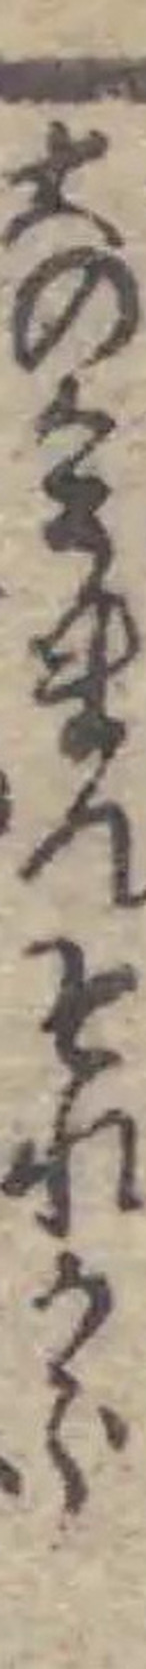大のかうまんそれから
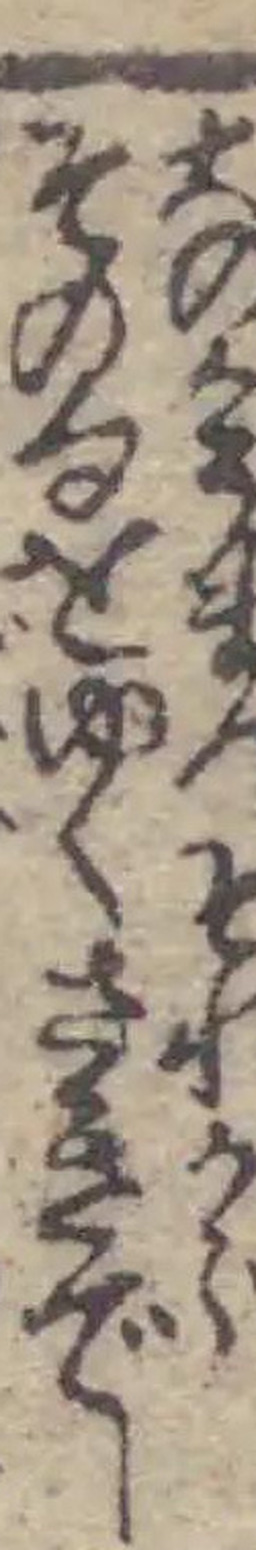その句をゆくさきで
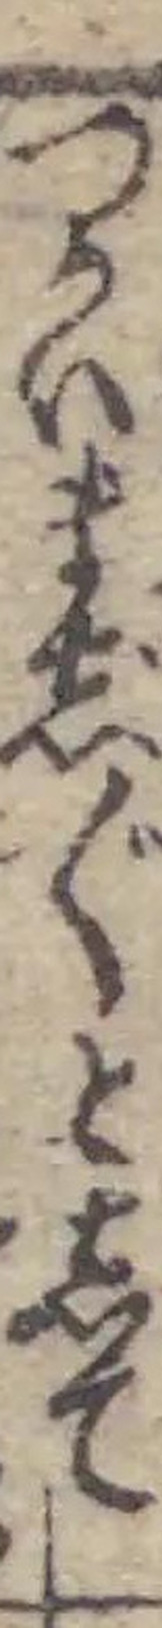つかいまじ〴〵として
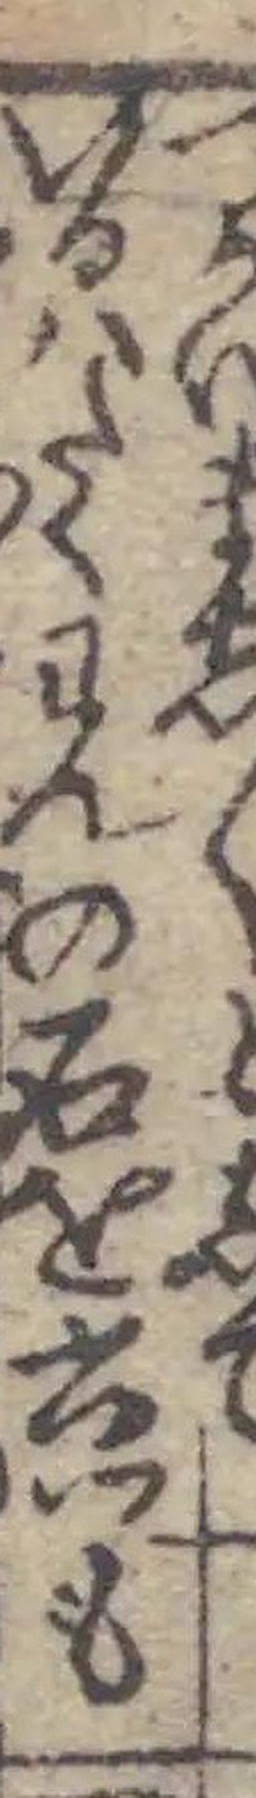いるはたくわんの石を六つも
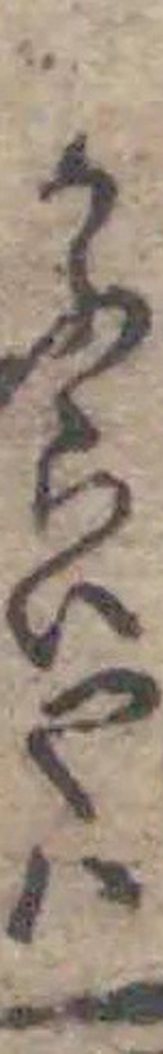かふらいやは
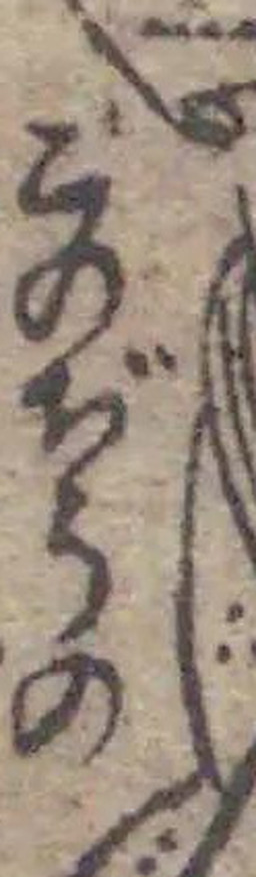このぢうの
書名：津以曽無弟の甚六 3巻
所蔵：国立国会図書館 National Diet Library, JAPAN
